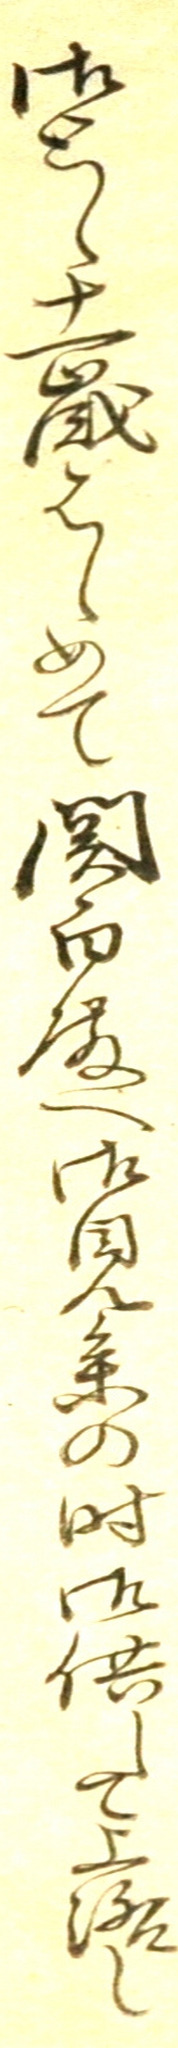御とし十一歳はしめて関白殿へ御見参の時御供して上洛し
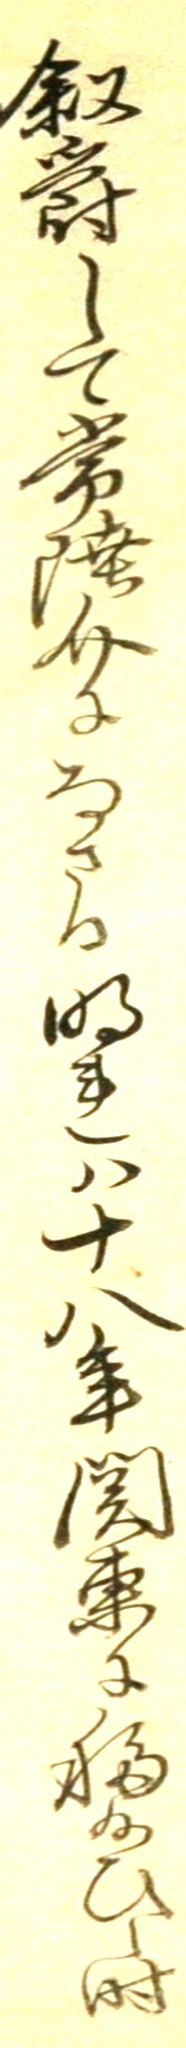叙爵して常陸介になさる明れは十八年関東に移給ひし時

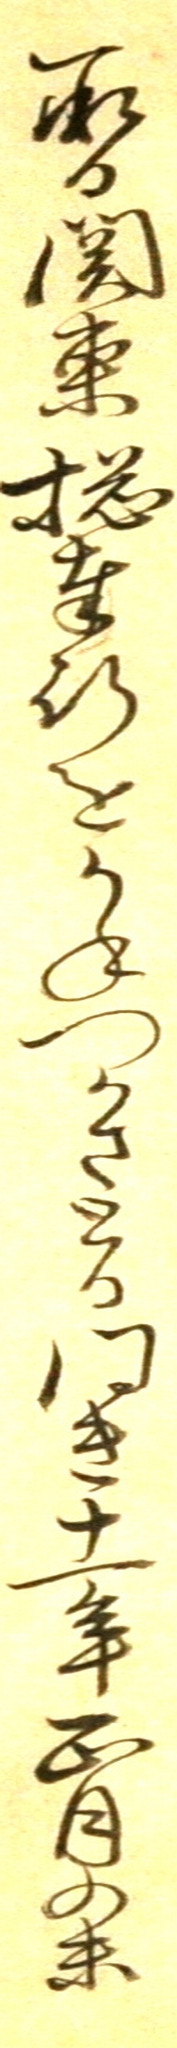承る関東総奉行をかねつかさとる同き十一年正月の末
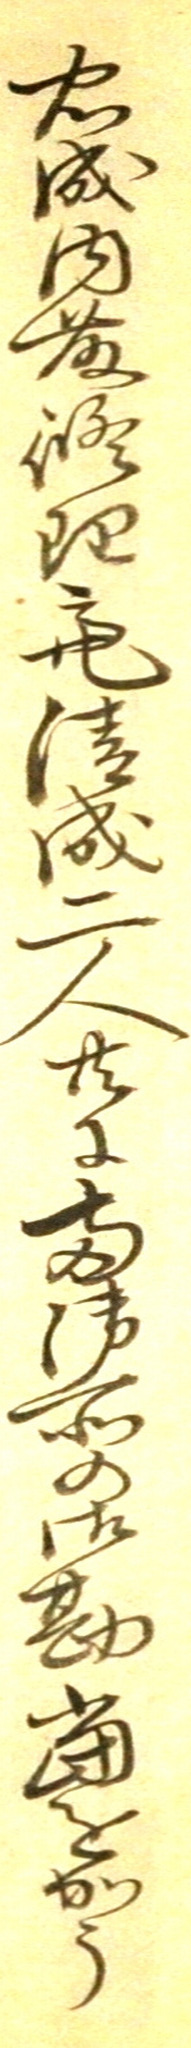忠成内藤修理亮清成二人共に両御所の御勘当をかう
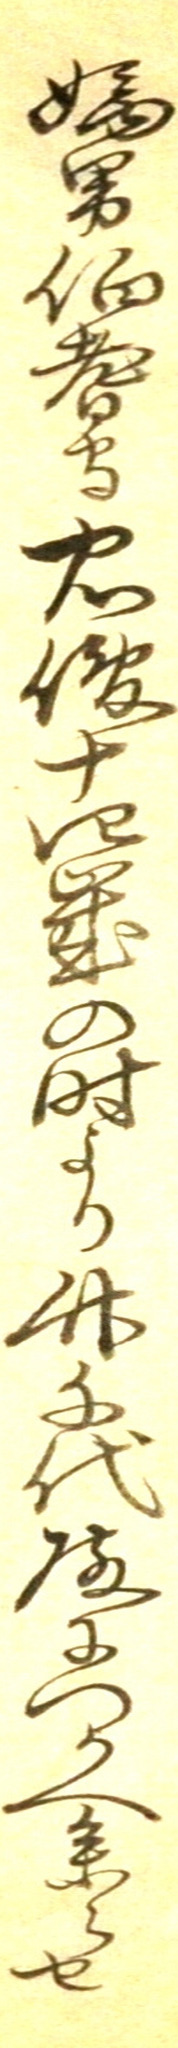嫡男伯耆守忠俊十四歳の時より竹千代殿につかへ参らせ
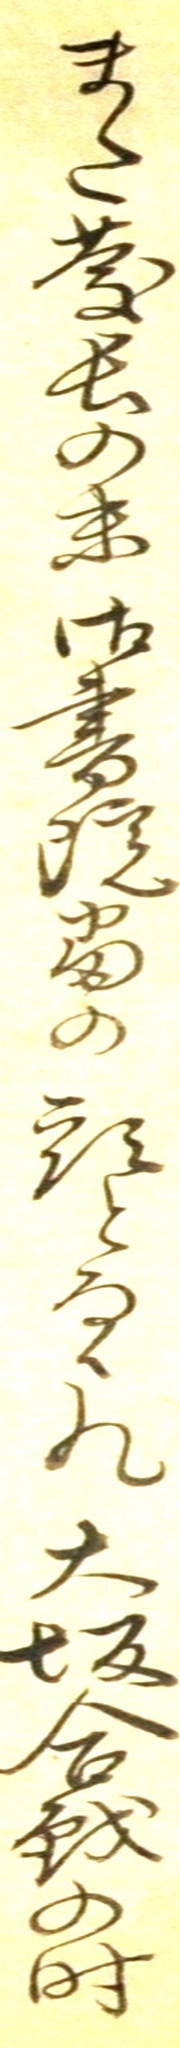また慶長の末御書院番の頭となされ大坂合戦の時
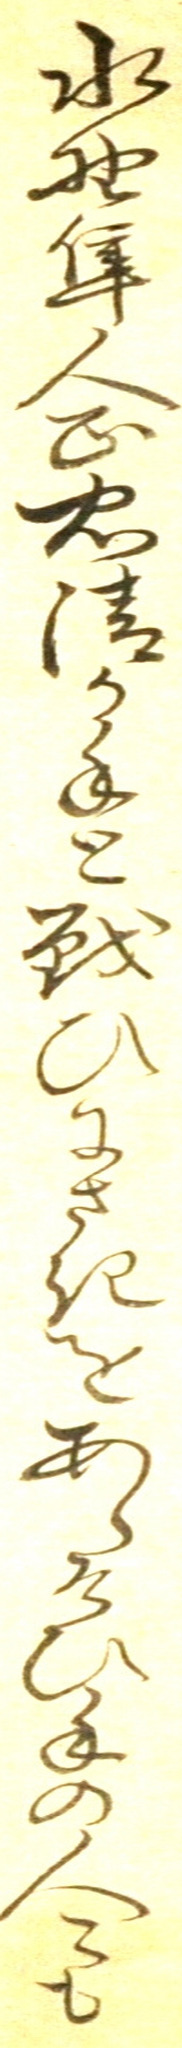水野隼人正忠清か手と戦ひにさきをあらそひ手の人々も
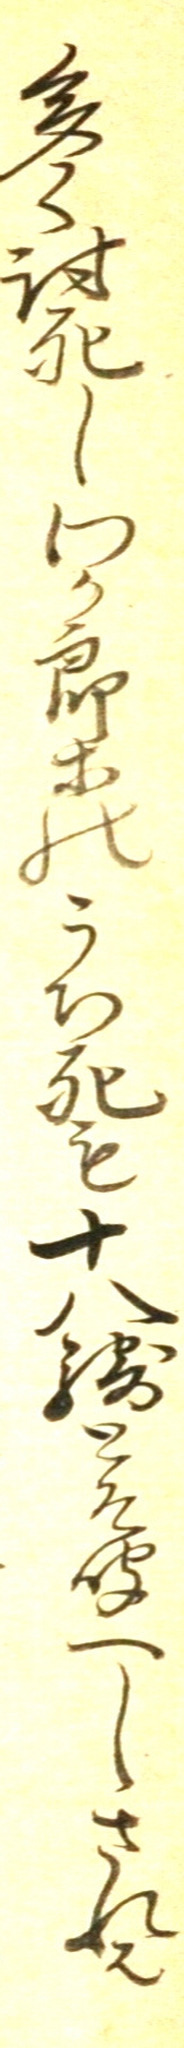多く討死しわか郎等のうち死も十八騎とそ聞へしされは
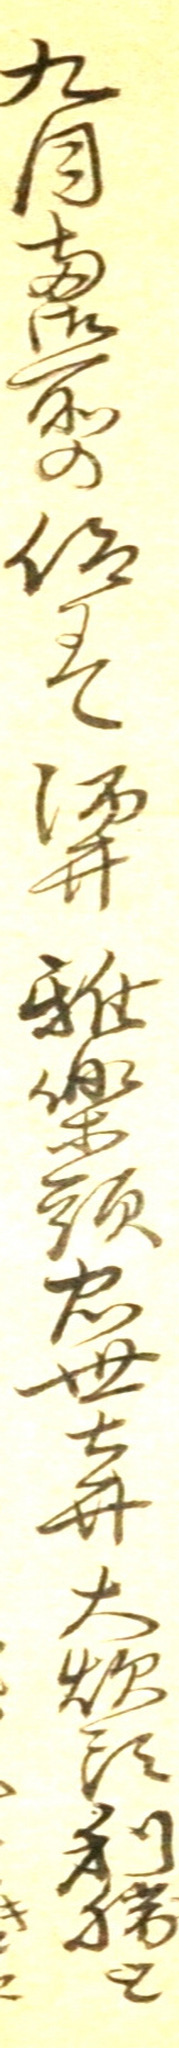九月両御所の仰にて酒井雅楽頭忠世土井大炊頭利勝と
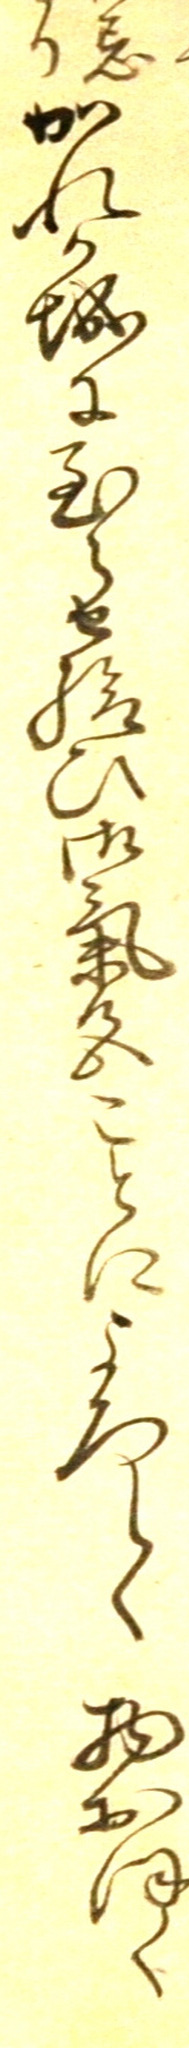御忌なりかれか城に至らせ給ひ御気色ことによろしく物おほく
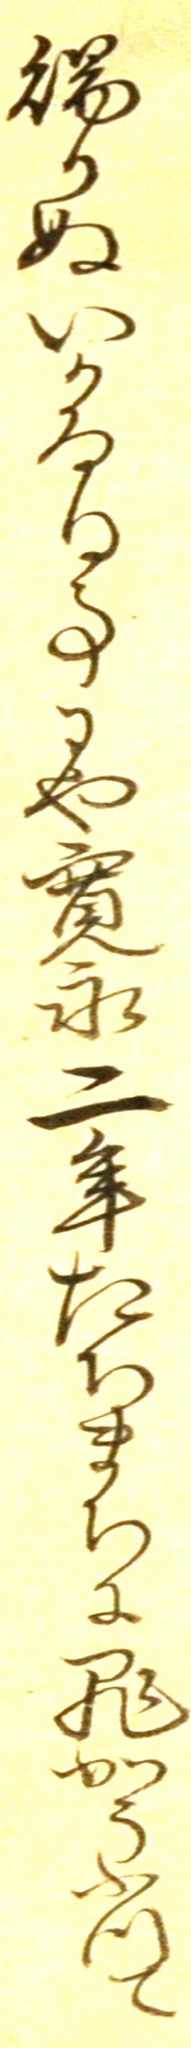賜りぬいかなる事にや寛永二年たちまちに罪かうふつて

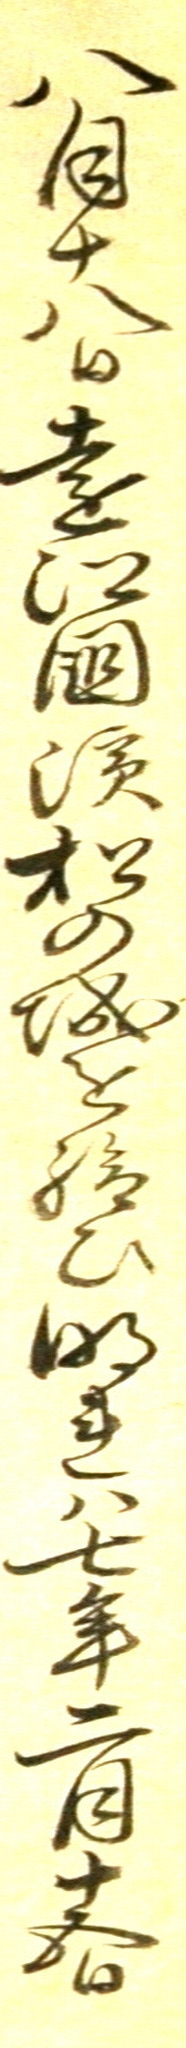八月十八日遠江国浜松の城を給ひ明れは七年二月十五日
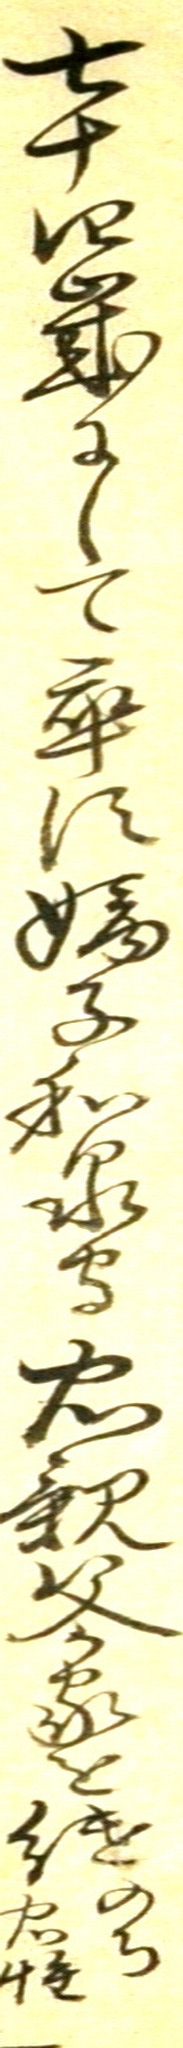七十四歳にして卒す嫡子和泉守忠親父か家を継のち忠雄」
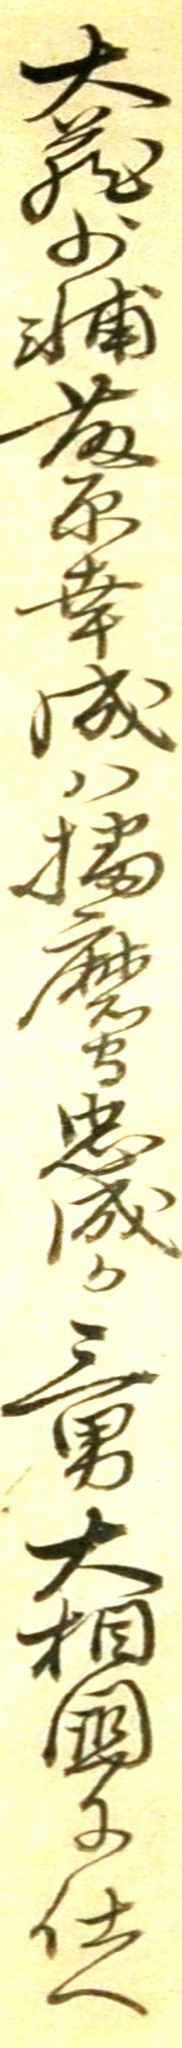大蔵少輔藤原幸成は播磨守忠成か三男大相国に仕へ
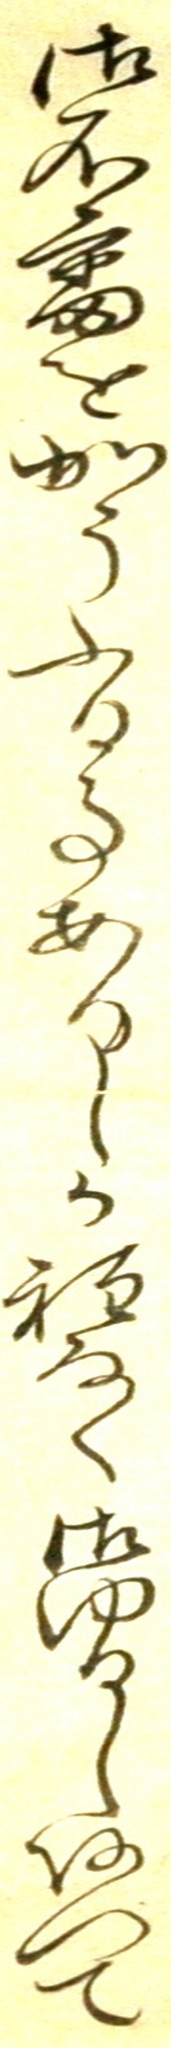御不審をかうふる事ありしか程なく御ゆるしあつて
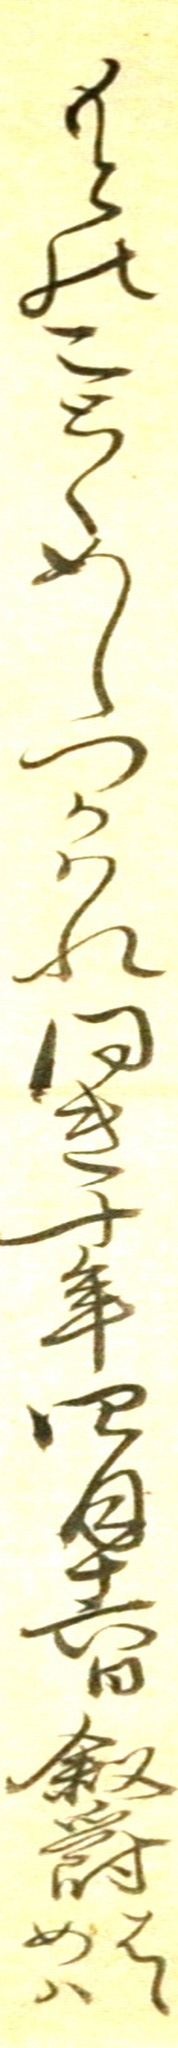もとのことくめしつかわれ同き十年四月十六日叙爵はしめは
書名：藩翰譜（五）
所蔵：伊那市立高遠町図書館・合同会社AMANE
